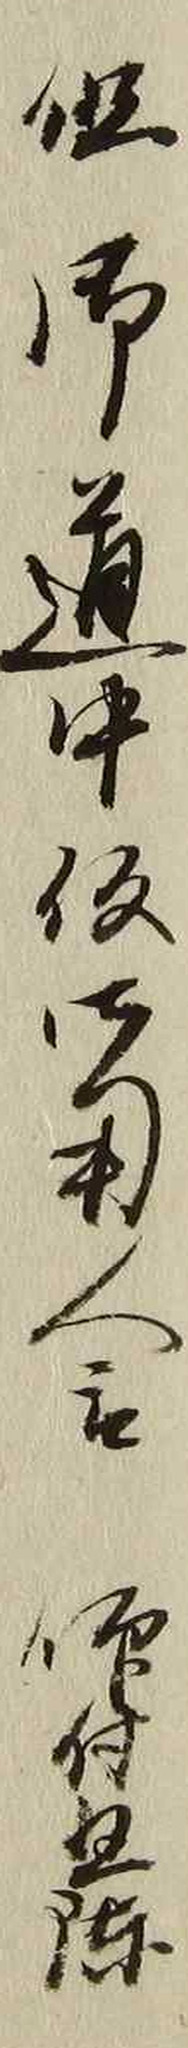但御道中仮御用人被仰付且陣
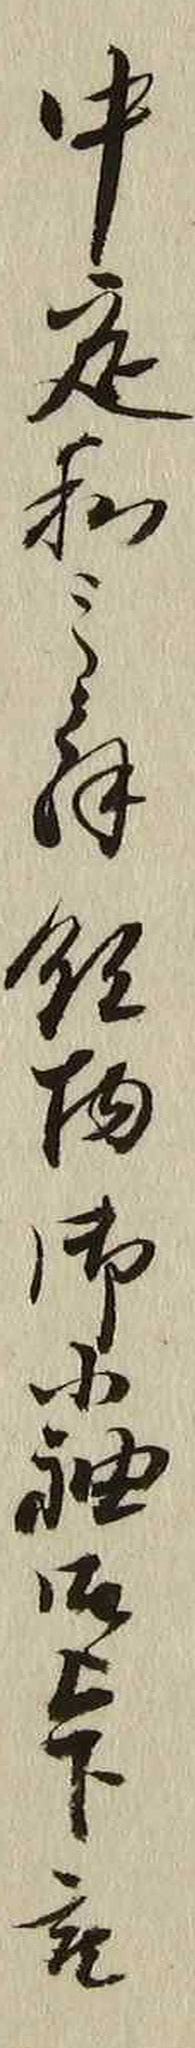中定和之拝領物御小袖御上下被
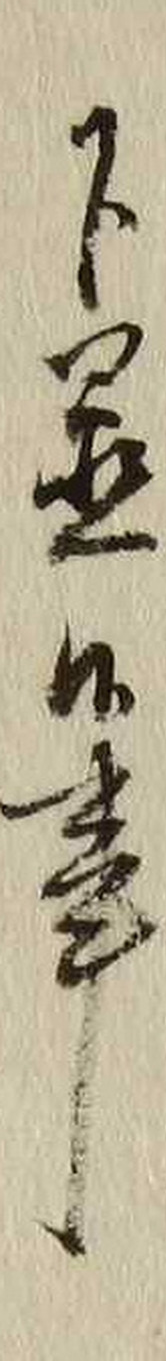下置候事
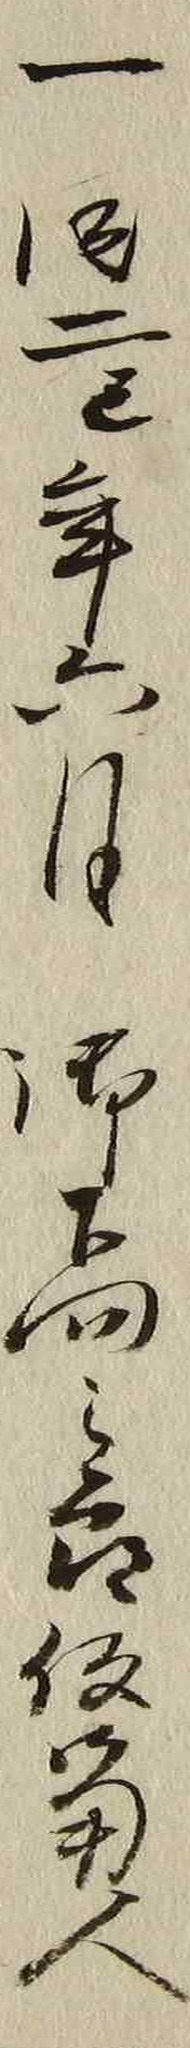一同二巳年六月御下向之節仮御用人
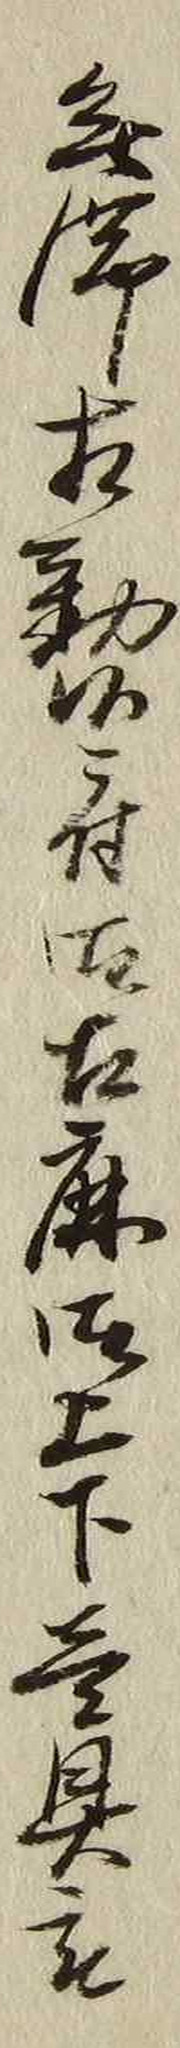無滞相勤候ニ付御古麻御上下壱具被
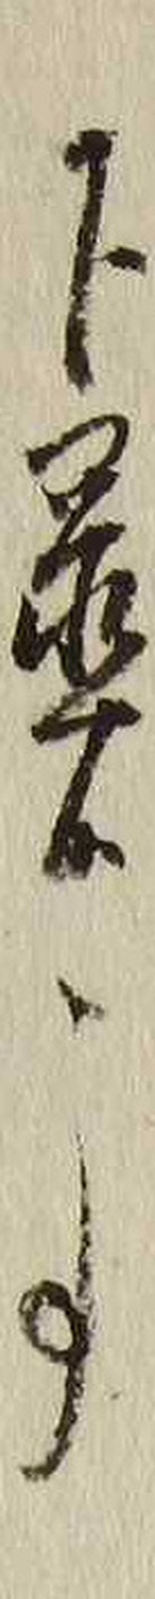下置候事
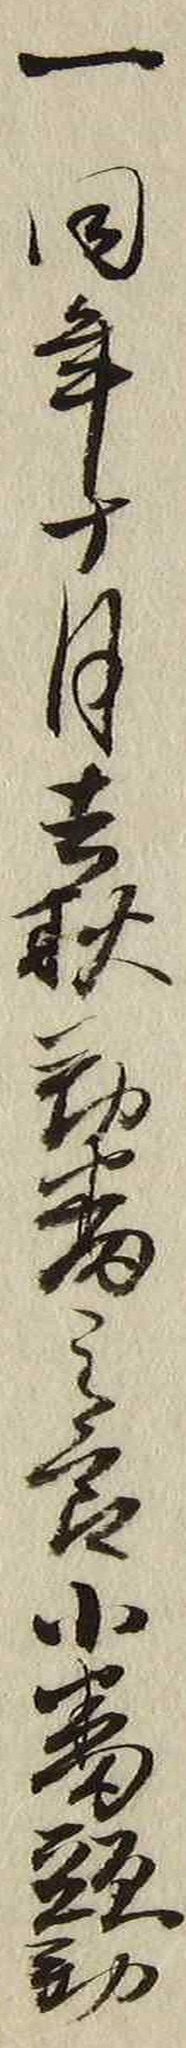一同年十月去秋勤番之節小番頭勤
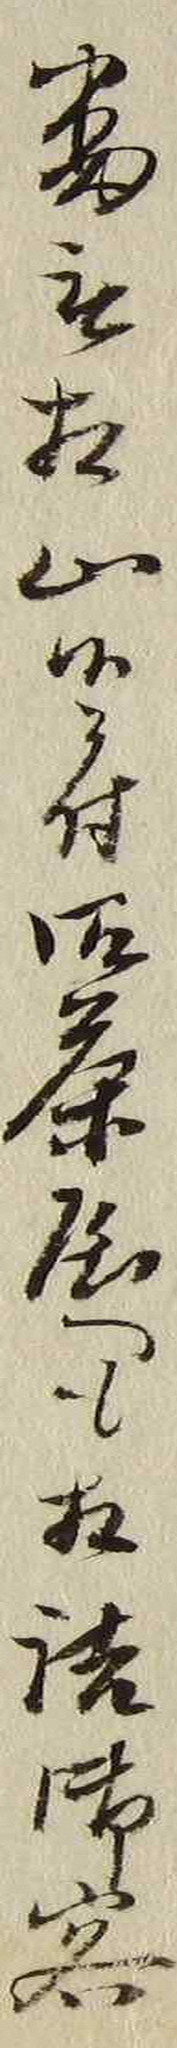番被相止候ニ付御茶屋へも相詰御客
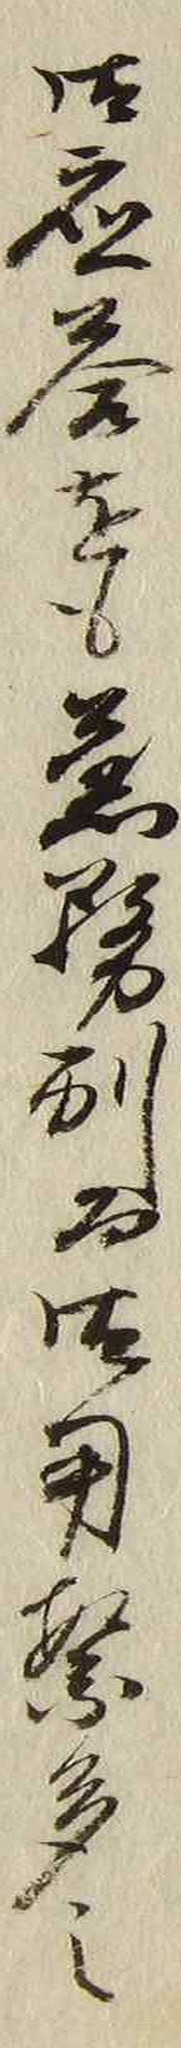御応答をも兼務別而御用繁多之
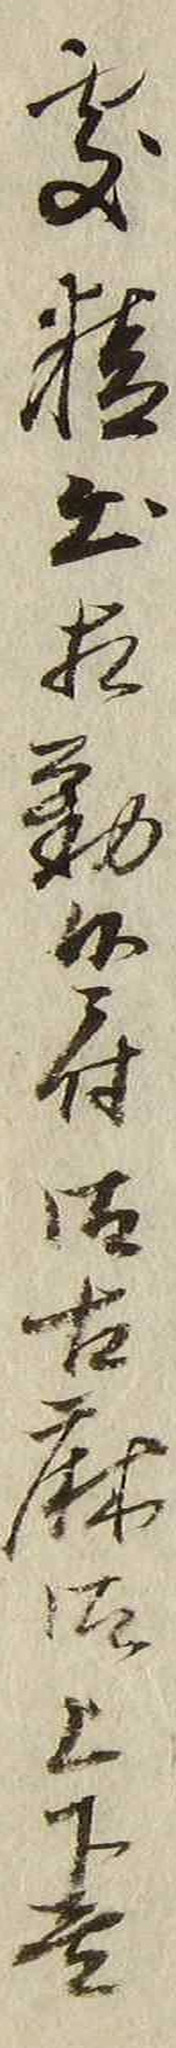処精出相勤候ニ付御古麻御上下壱

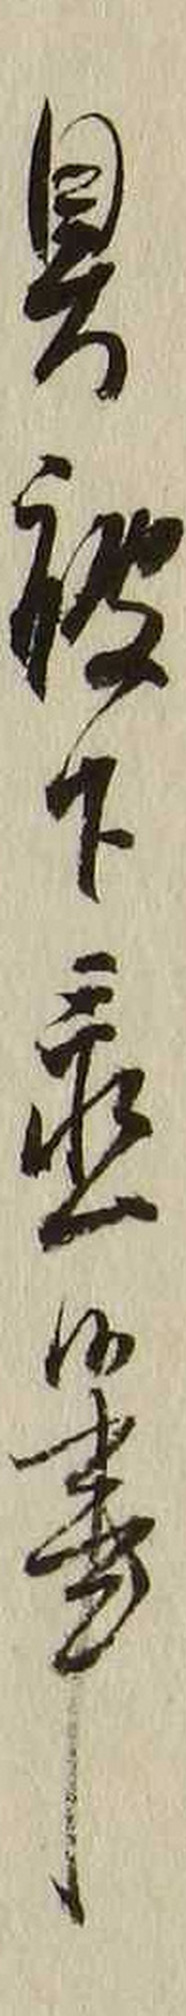具被下置候事
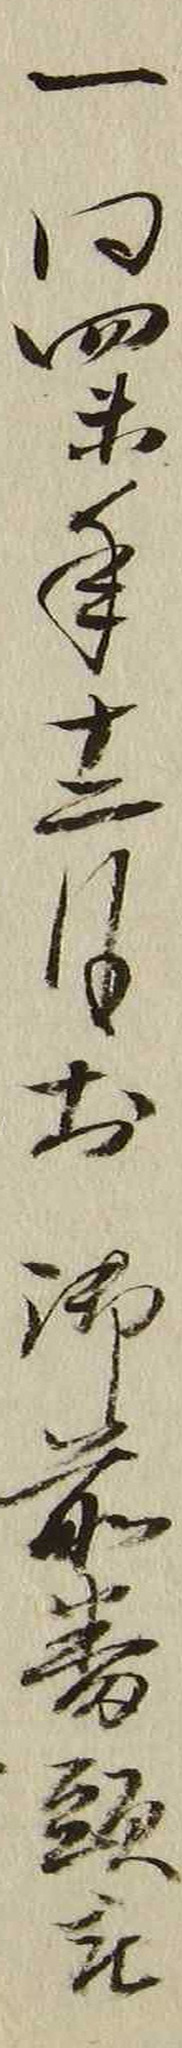一同四未年十二月於御前番頭被
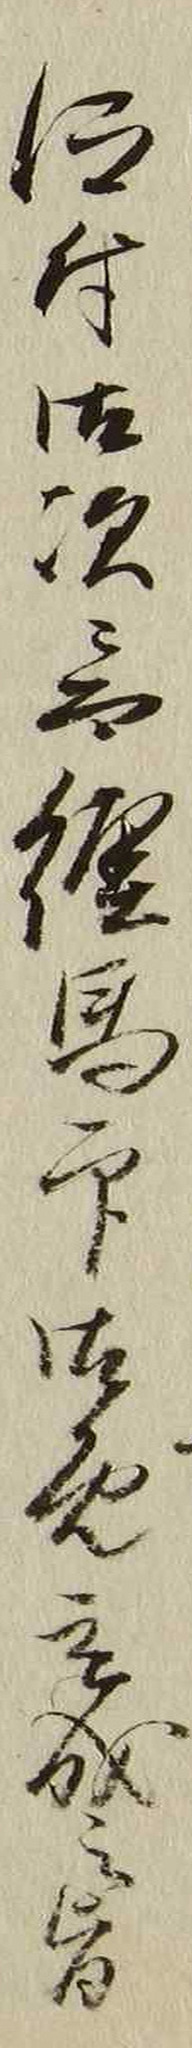仰付御次ニ而纏馬印御免被成之旨
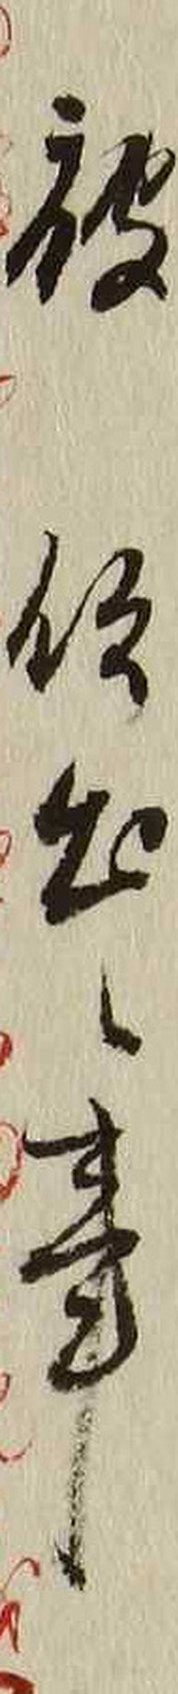被仰出候事
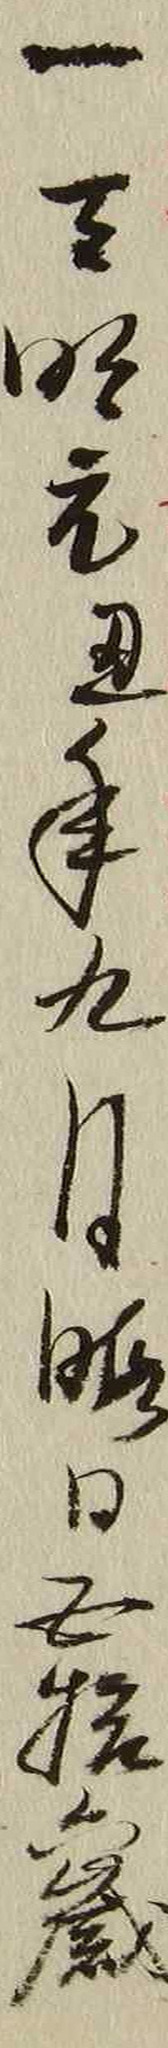一天明元丑年九月晦日五拾六歳
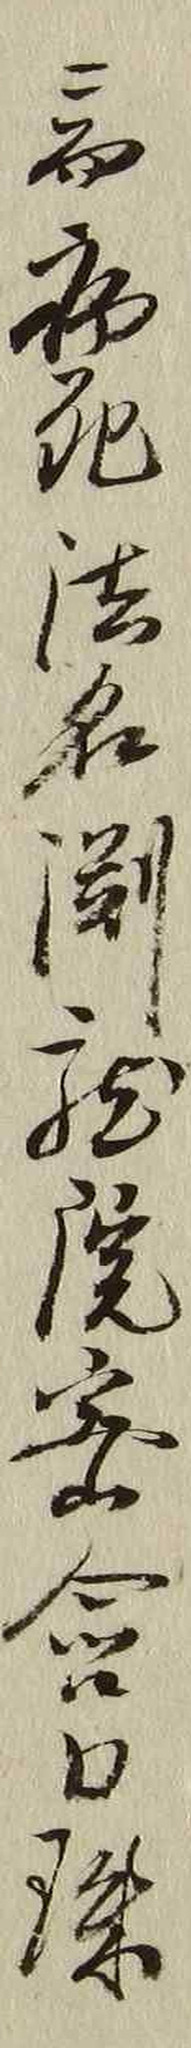ニ而病死法名渕龍院密含日珠
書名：諸士系譜　巻之351　す之部1
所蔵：会津若松市立会津図書館
